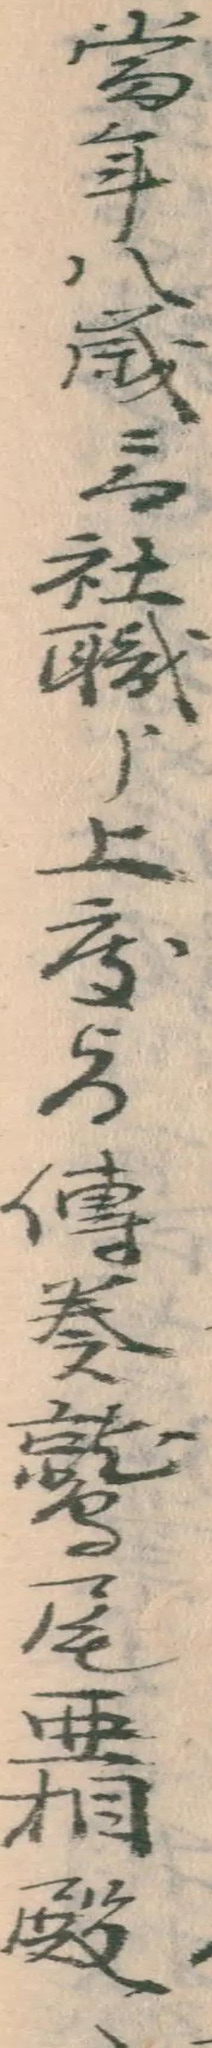當年八歳ニ而社職申上度旨傳奏鷲尾亜相殿へ
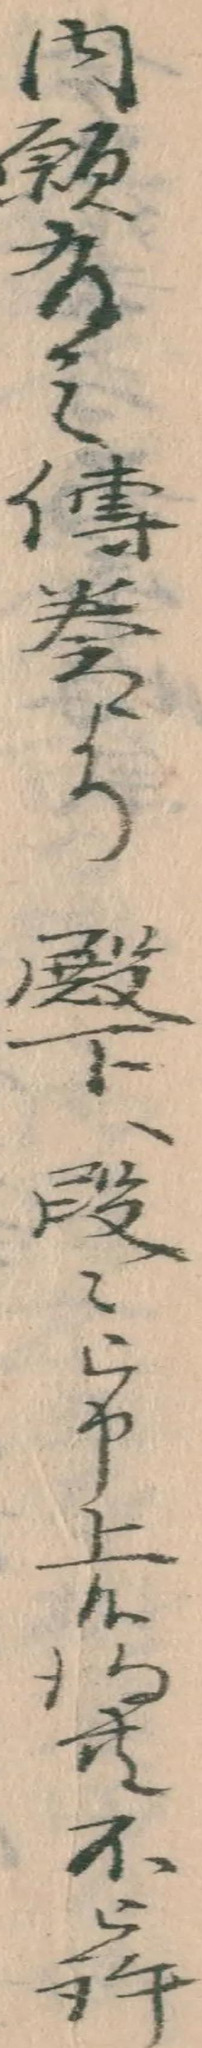内願有之傳奏より殿下へ段々被申上候得共不被許
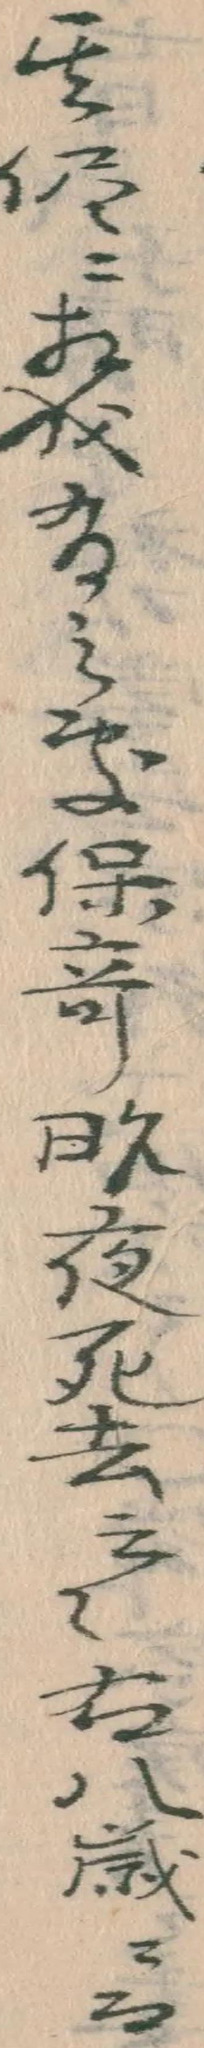其侭二相成有之處保竒昨夜死去云々右八歳ニ而
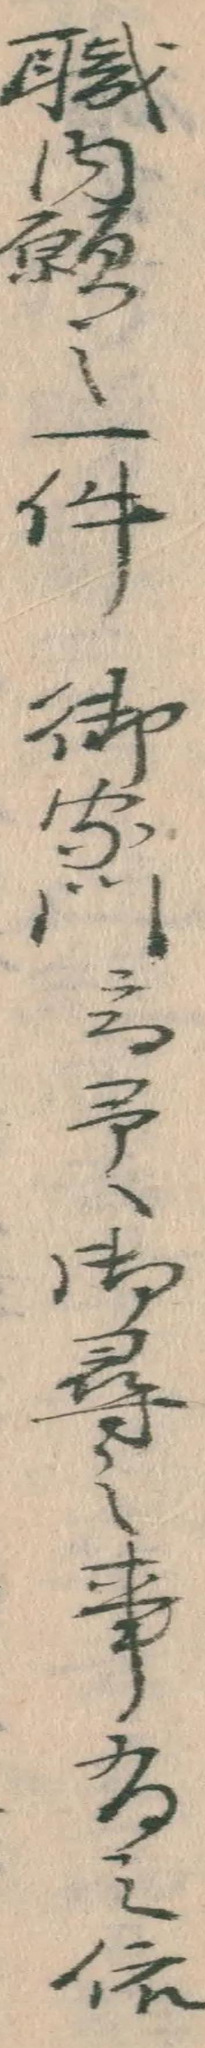職内願之一件御家門ニ而予へ御尋之事有之依
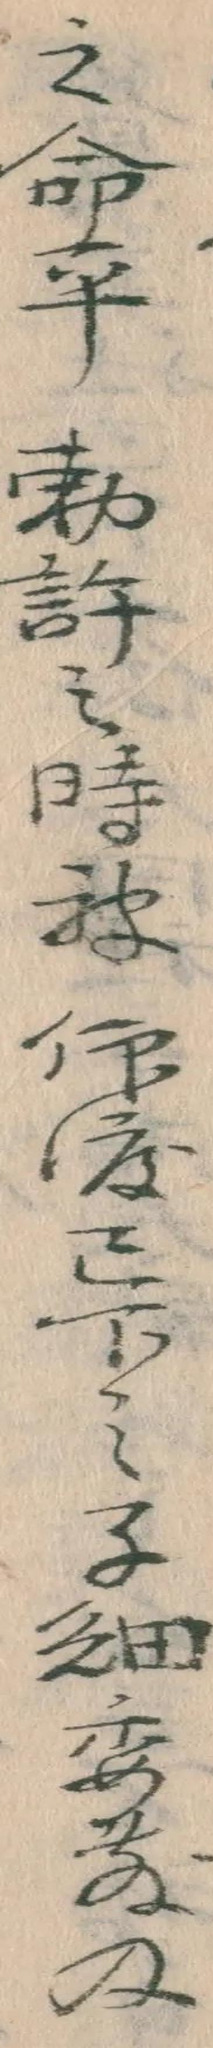之命平勅許之時被仰渡已下之子細委敷及
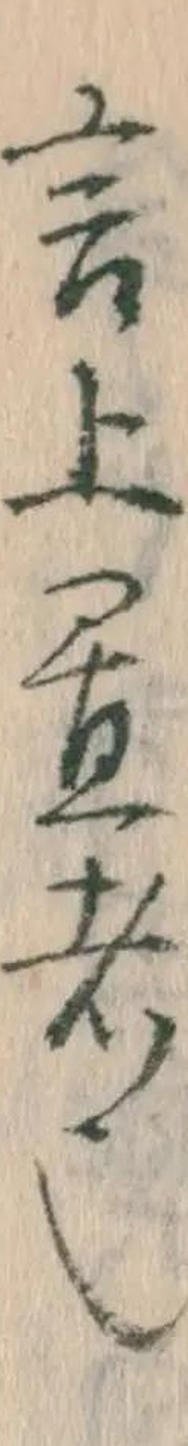言上置者也
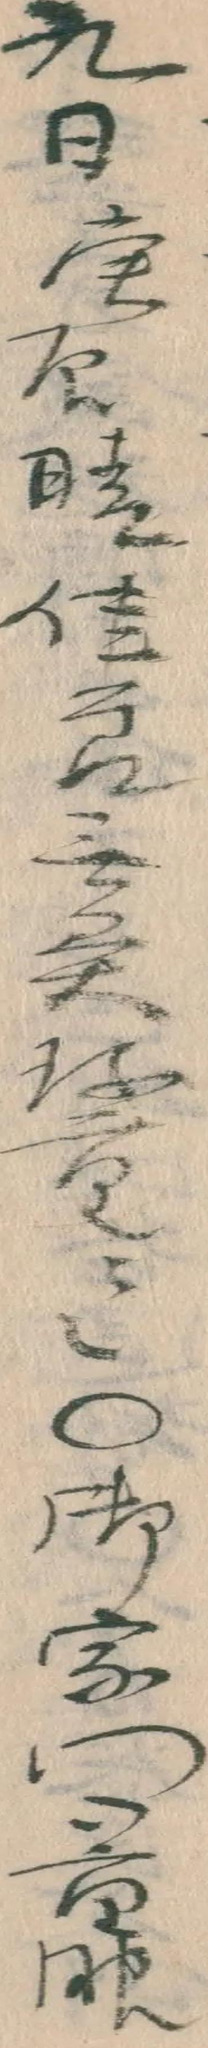九日庚辰晴佳節無異珍重〻〻〇御家門御重服
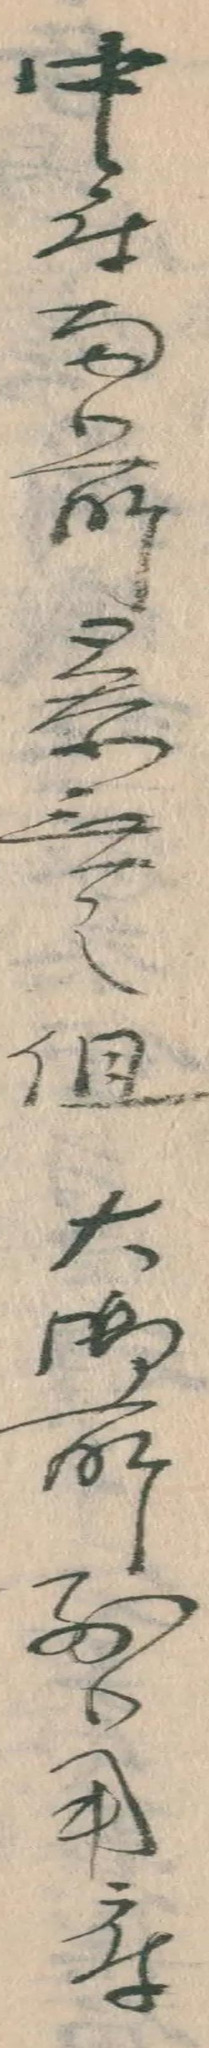中ニ付両御所御参無之但大御所別御用ニ付
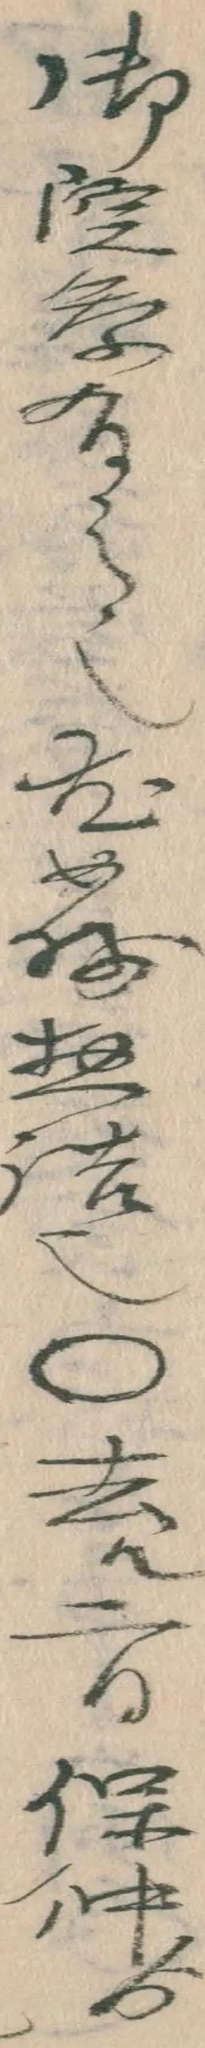御院参有之也尤如何惣詰也○去ル二日保仲ゟ
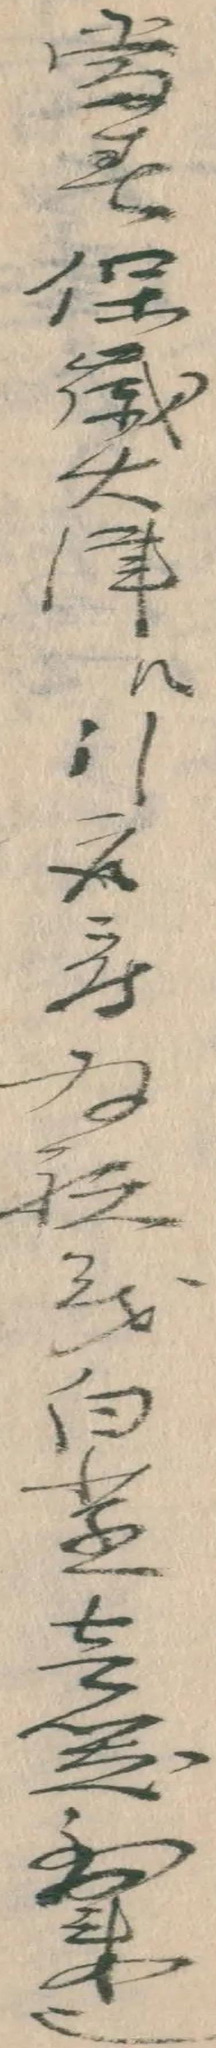當春保歳大津え引取に付為祝義白蒸壱笑到来也
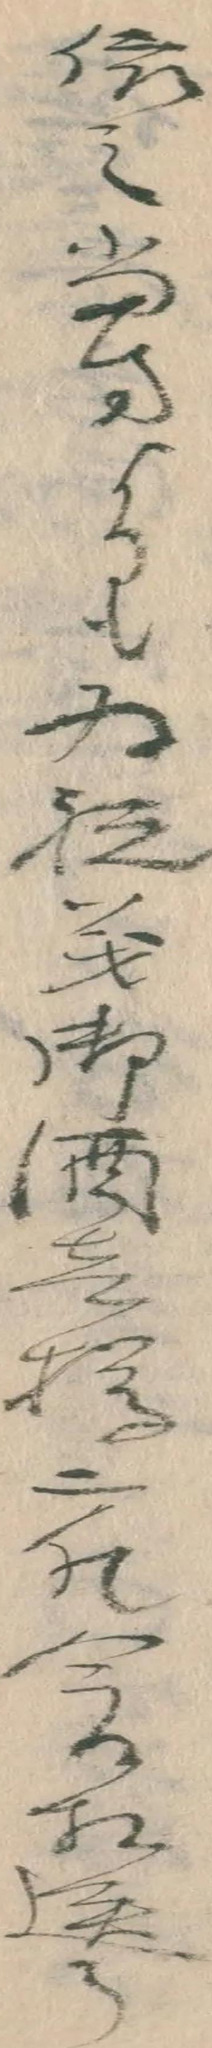依之當方よりも為祝義御酒壱樽二凡今日相送了
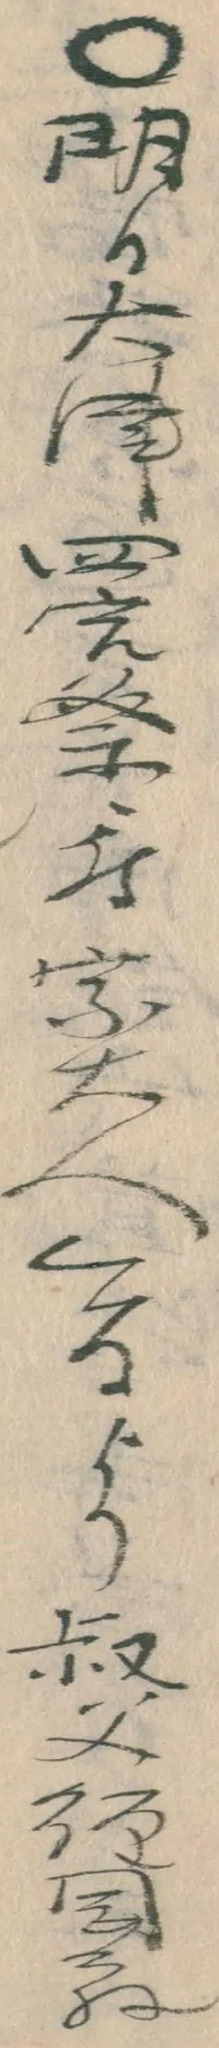○明日大津四宮祭に付家大人今日より叔父経国翁
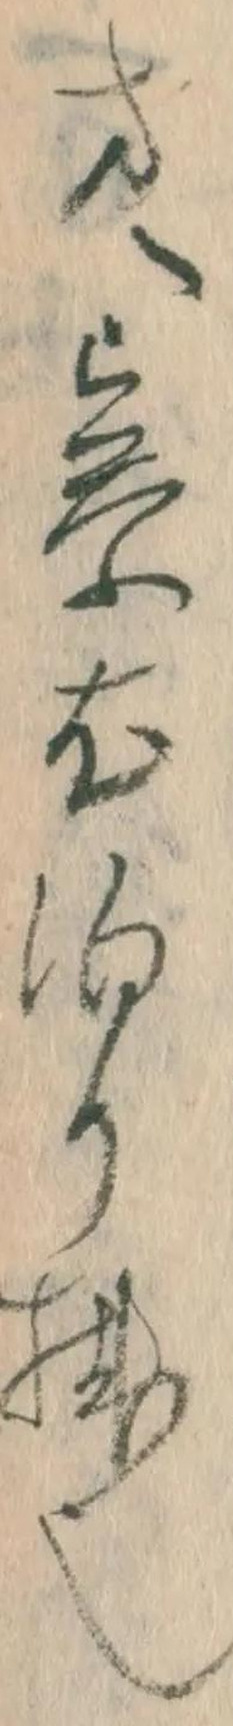方へ被参尤泊り掛也

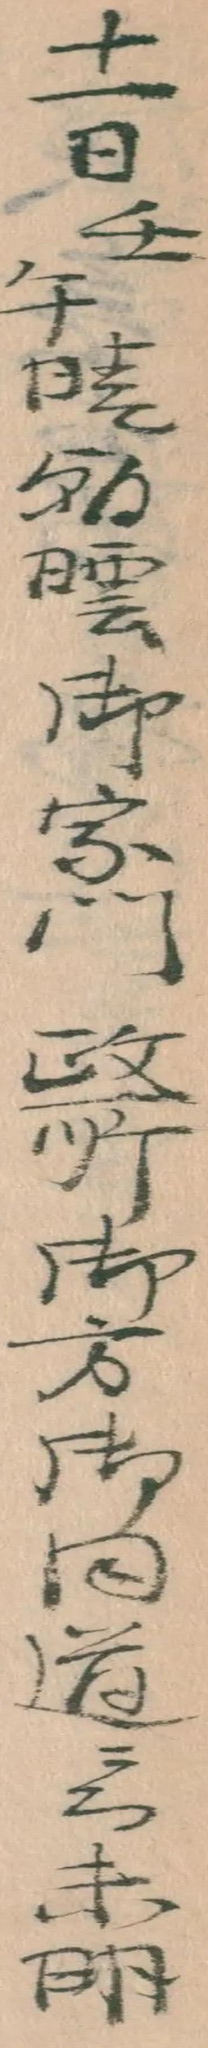十一日壬午晴朝雲御家門政所御方御同道ニ而未明
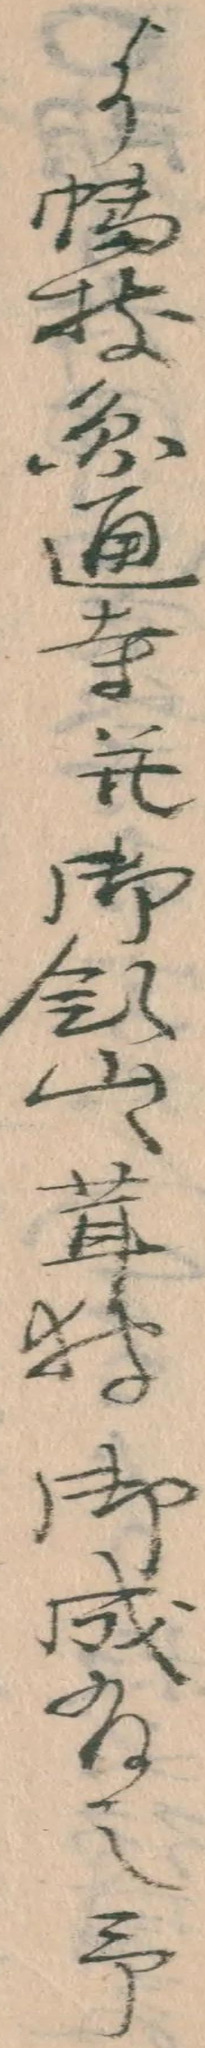より幡枝円通寺幷御領山へ茸狩御成有之予
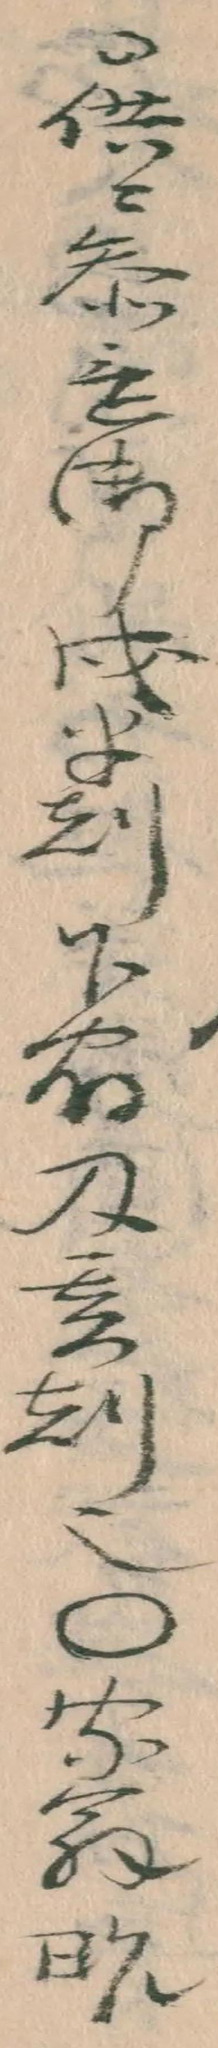御供ニ参還御戌半刻下宿及亥刻也○家翁昨
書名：賀茂社記録. 第63冊
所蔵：国立国会図書館 National Diet Library, JAPAN
